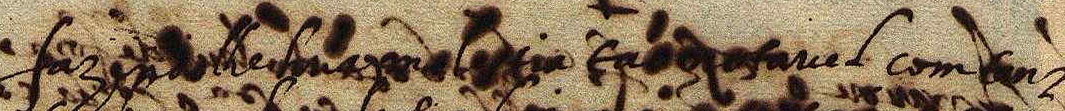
fazendolhe hūa molestia taõ notauel com tan
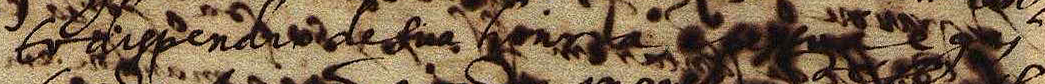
to dispendio de sua honrra e pessoa e gas
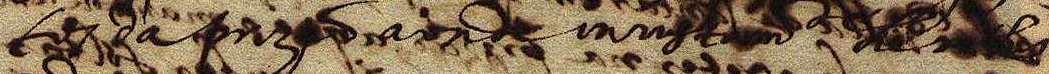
tos da prizaõ aonde iniustamte he cōthe
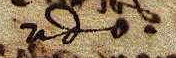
udo.
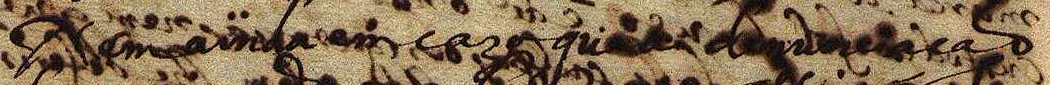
Nem ainda em cazo que a denunciaçaõ
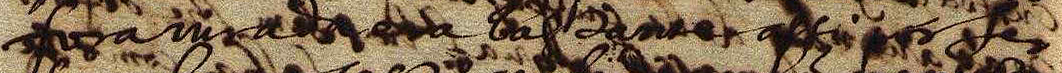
fora iurada era bastante assi por ser
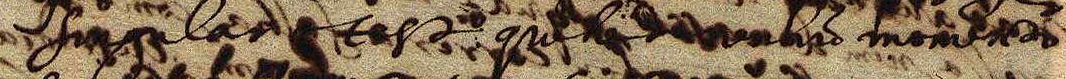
singular o testo que he de nenhū momento
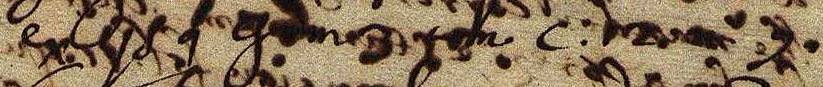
ex 189 gomez tom c. 12 no 9
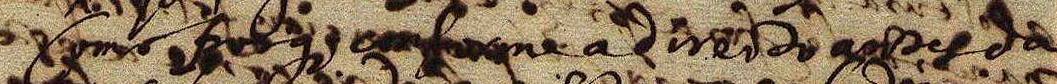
Como porq conforme a direito antes da
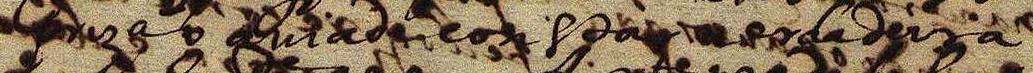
prizaõ auiada consta uerdadeira
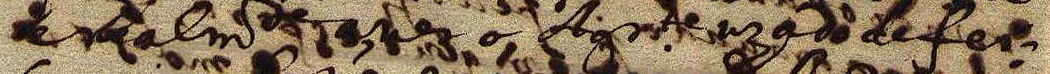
e realmte auer o Agr.te uzado de fei
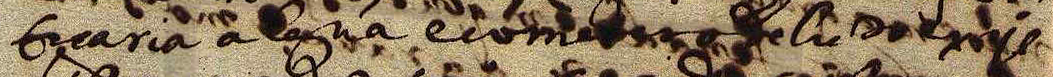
tiçaria alguā e cometer o delicto ex 16
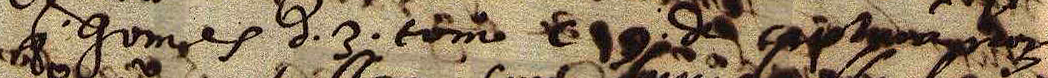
q̄. gomes d. 3. tomo C 19 de captura reo
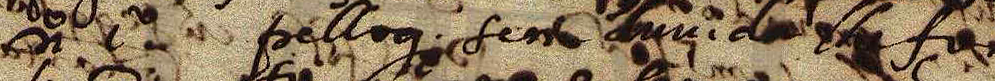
no 1o pello q. sem duuida lhe foi
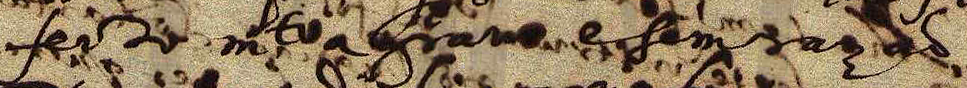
feito m.to agrauo e sem razaõ
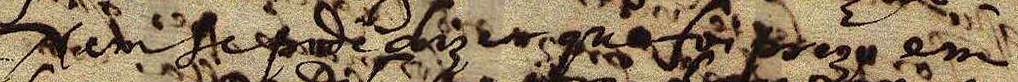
Nem se pode dizer que foi prezo em
